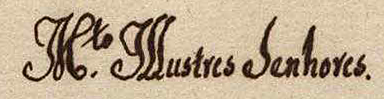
M.to Illustres Senhores.
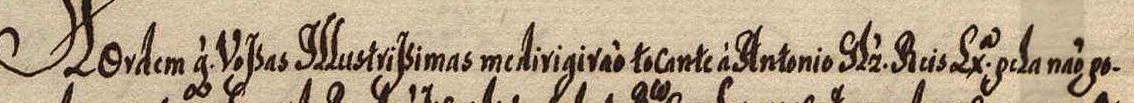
A Ordem q̄ Vossas Illustrissimas me dirigiraõ tocante á Antonio Glz̄ Reis Lx.a pela naõ po
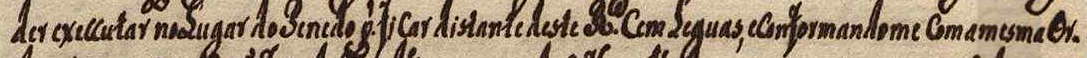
der execcutar no Lugar do Penedo, p̄ ficar distante deste R.co Cem Leguas, e Conformandome Com a mesma Or.
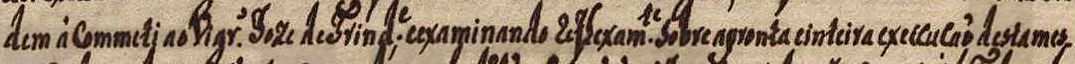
dem á Commeti ao Vigr.o Ioze de Trind.e e examinando Reflexam.te sobre a pronta e inteira execcuçaõ desta mes
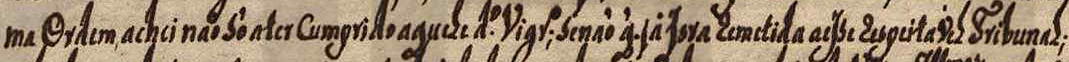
ma Ordem achei naõ só a ter Cumprido aquele d.o Vigr.o; senaõ q̄ já fora Remetida a esse RespeitaVel Tribunal;
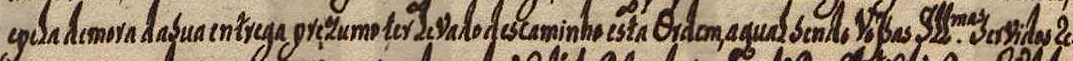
e pela demora da sua entrega preZumo ter LeVado descaminho esta Ordem, a qual sendo Vossas Ill.mas servidas Re
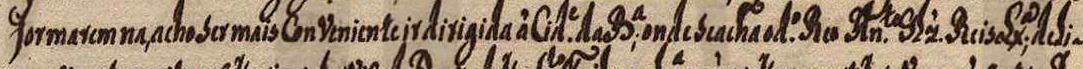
formaremna, acho ser mais ConVeniente ir dirigida à Cid.e da B.a; onde se acha o d.o Reo An.to Glz̄ Reis Lx.a; deli
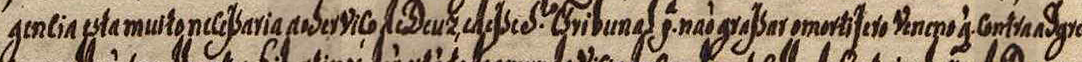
gencia esta muito necessaria ao serviço de Deuz, e desse S.to Tribunal p.a naõ grassar o mortifero Veneno q̄ contra a Igre
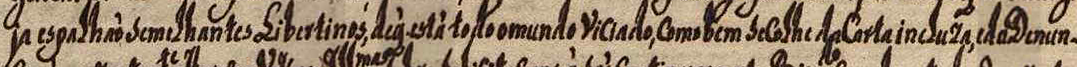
ja espalhaõ semelhantes Libertinos, de q̄ está todo o mundo Viciado, como bem se colhe da Carta incluza, e da Denun
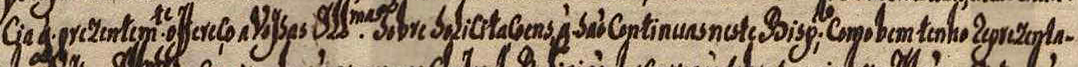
Cia q̄ prezentem.te offereço a Vossas Ill.mas Sobre SolicitaÇoens, q̄ saõ continuas neste Bisp.do; como bem tenho Reprezenta
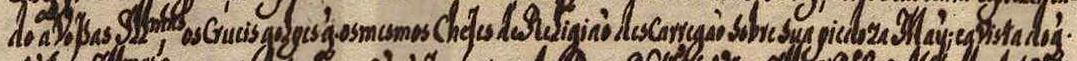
do a Vossas Ill.mas, os Crueis golpes q̄ os mesmos Chefes de Religiaõ desCarregaõ sobre sua piedoza Maȳ; e a Vista do q̄
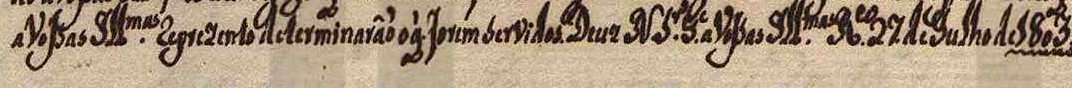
a Vossas Ill.mas Reprezento determinarão o q̄ forem serVidos. Deuz N.S.r G.e a Vossas Ill.mas R.co 27 de Iulho de 1803.
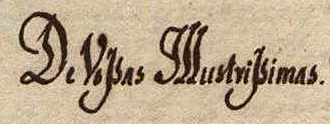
De Vossas Illustisimas.
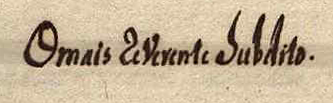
O mais ReVerente subdito.
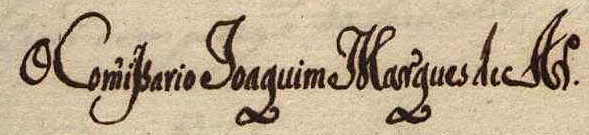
O Com̄issario Ioaquim Marques de Ar.o
